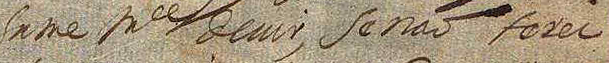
same mce de uir, se naõ terei
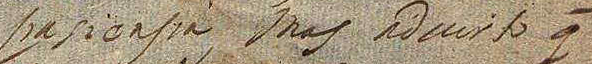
pasiensia, mas aduirto q̄
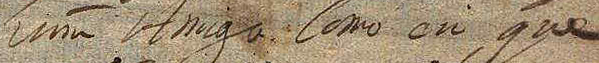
hum Amigo Como eu que
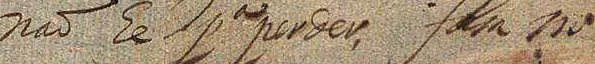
naõ he pa perder, fasa me
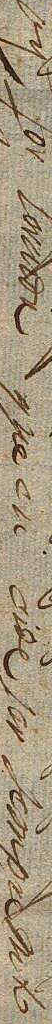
o q̄ for seruida que eu eide ser sempre mto
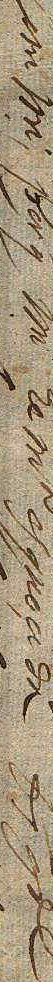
Com vm, porq̄ vm he mto esquecida Ds̄ gde
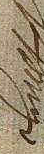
Amigo
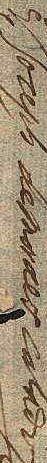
Joseph de Moraes calado
